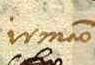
irmaõ
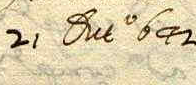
21 Out.o 642
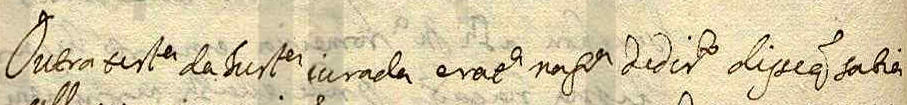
Outra testa da Iusta iurada era ta na fra de dirto disse q̄ sabia
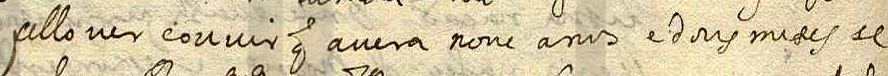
pello uer e ouuir q̄ auera noue anos e dous messes se
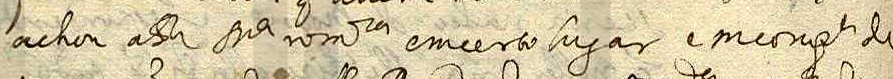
achou a R Ma romra em certo lugar em compa de
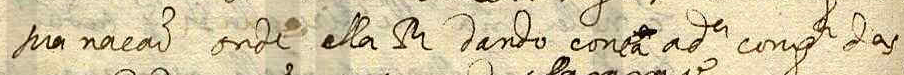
sua naçaõ onde ella R dando conta a da compa das
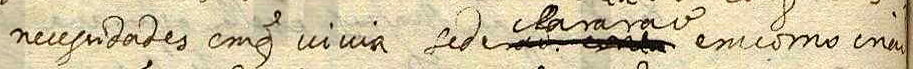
necessidades em q̄ uiuia se declararaõ em como criaõ
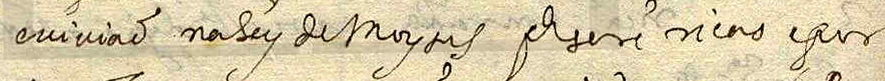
e uiuiaõ na ley de Moyses pa serē ricas e por
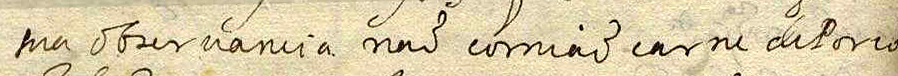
sua obseruancia naõ comiaõ carne de Porco
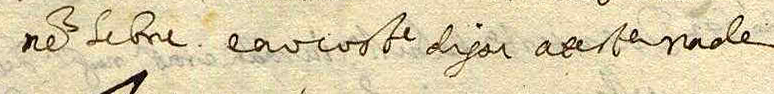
nē Lebre e ao coste disse a testa nada
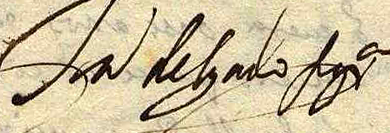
Joaõ delgado fgra
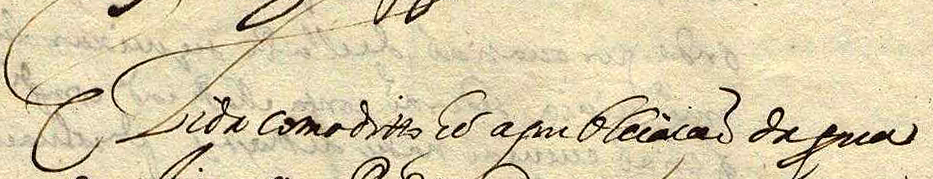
E Lida como ditto hé a publicaçaõ da sua
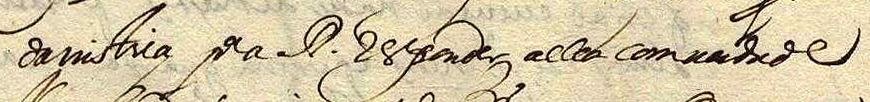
da iustiça pra R. responder a ella com uerdade
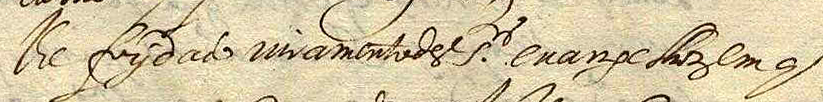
lhe foy dado uiramento dos S.tos euangelhos em q̄
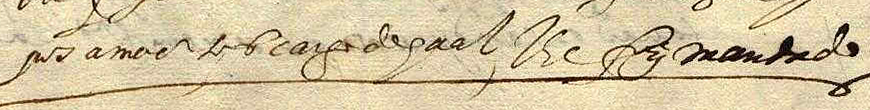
pos a maõ sob cargo do qual lhe foy mandado
